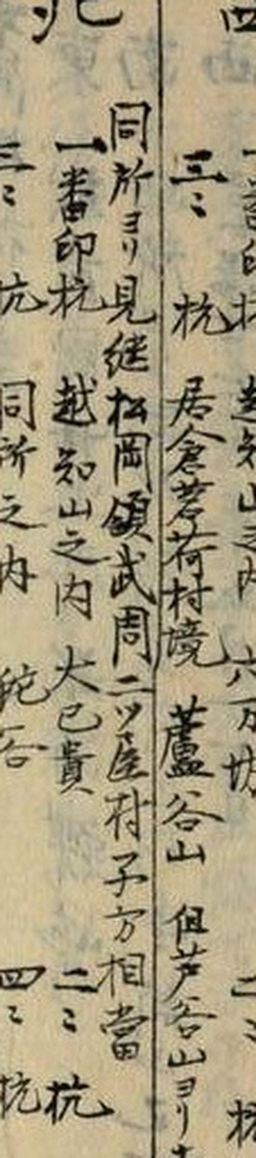北同所ヨリ見継松岡領武周二ツ屋村子方相当
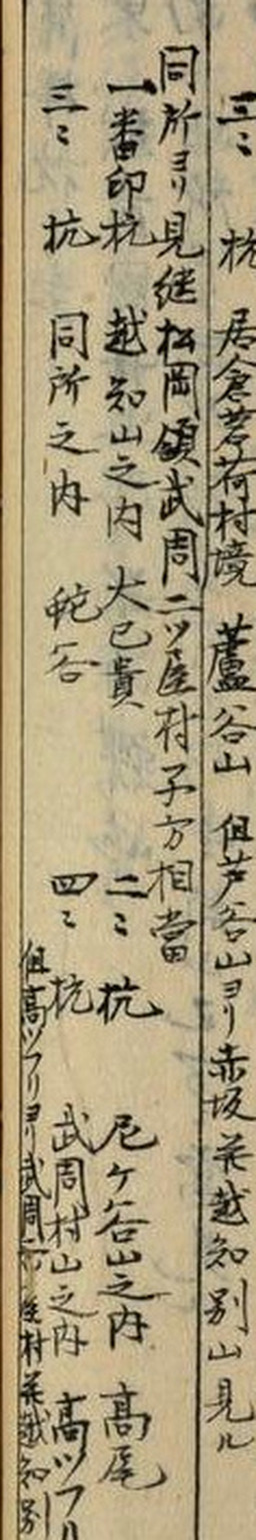一番印杭越知山之内大己貴二同杭尼ケ谷山之内高尾
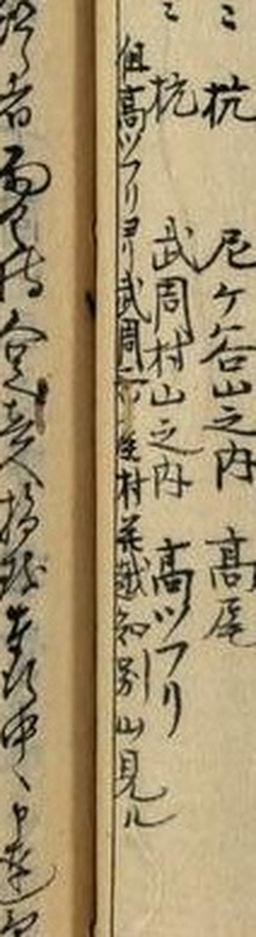但高ツフリヨリ武周村越知別山見ル
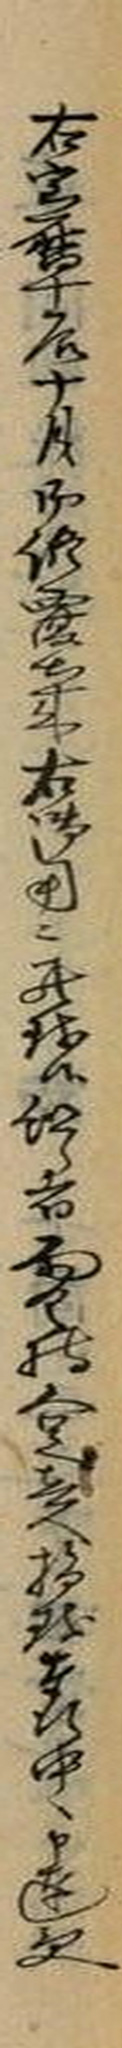右宝暦十辰十月御修覆出来右御用ニ罷越候組之者雨具持人足壱人指越奉行中へ申達受
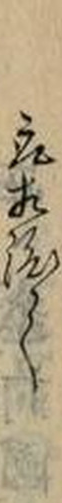取相渡之
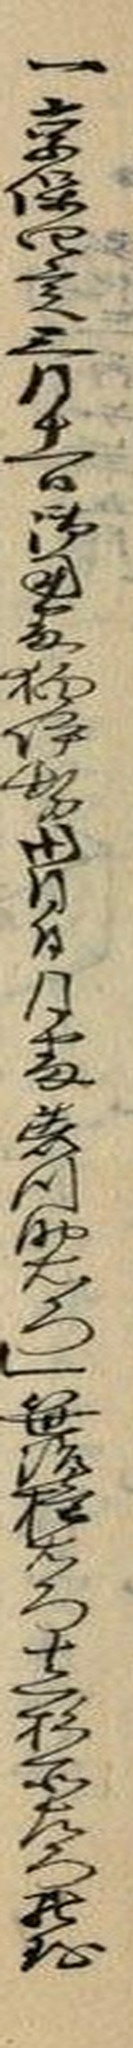一享保四亥三月十一日御用番狛伊勢御目付月番荒川助右衛門」笹治権右衛門真杉所左衛門罷越
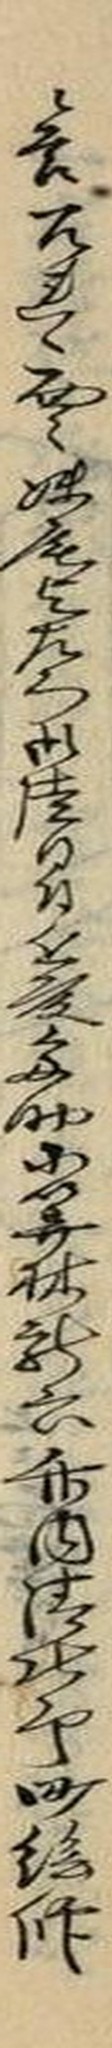候節召連候面々妹尾与左衛門御徒目付近藤多助小算林新六竹内清次郎町絵師
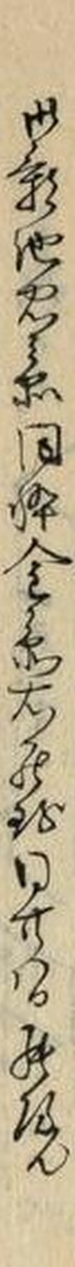御影池忠兵衛同忰金兵衛右罷越同廿八日罷帰ル
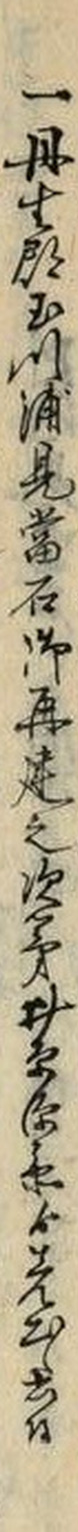一丹生郡玉川浦見当石御再建之次第井原源兵衛ゟ差出候書付
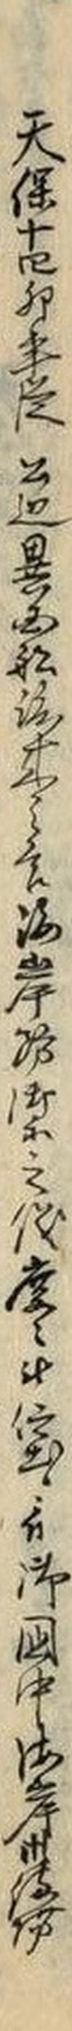天保十四卯年従公辺異国船渡来之節海岸防御之儀度々被仰出候ニ付御国中之海岸御備場
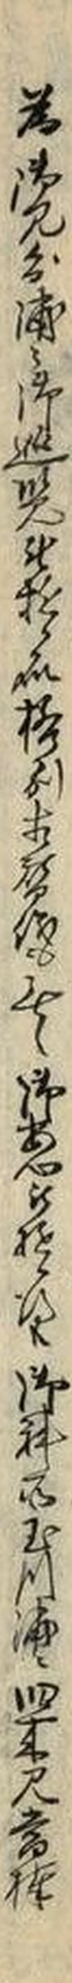為御見分浦々御巡覧被遊候処格別相替儀も無之御安心被遊候得共御料所玉川浦ニ旧来見当棒
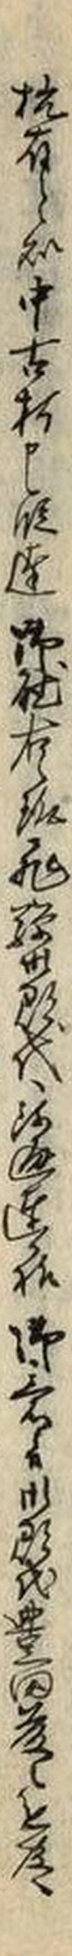杭有之候処中古朽申候段達御聴右之趣飛騨御郡代へ致通達候様御意ニ付御郡代豊田藤之進殿へ
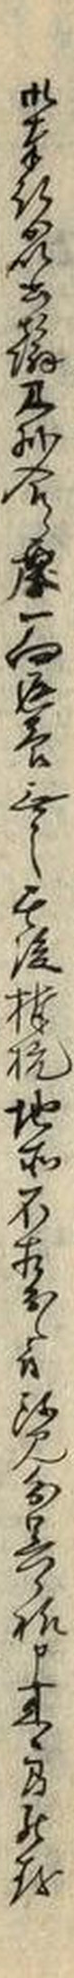御奉行ゟ以書翰及掛合候処一向返答無之其後棒杭地所不相分候ニ付致見分呉候様申来候間罷越
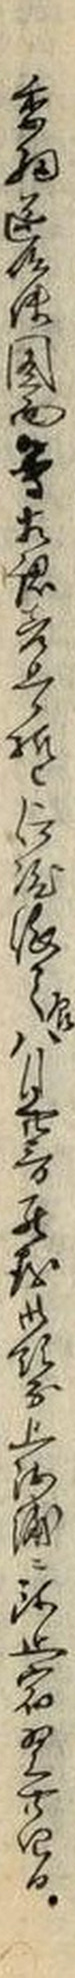委細遂吟味図面等相認差上候様被仰渡依之辰八月廿三日罷越御領分上海浦ニ致止宿翌廿四日
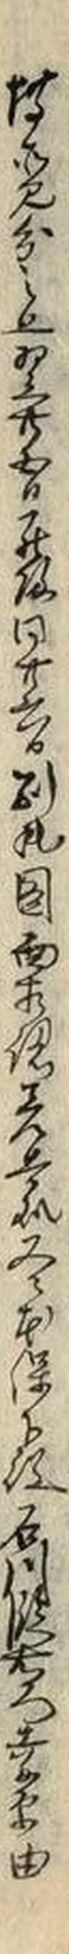場所見分之上翌廿五日罷帰同廿六日別紙図面相認差上候処又々本保下役石川臨右衛門桑原由
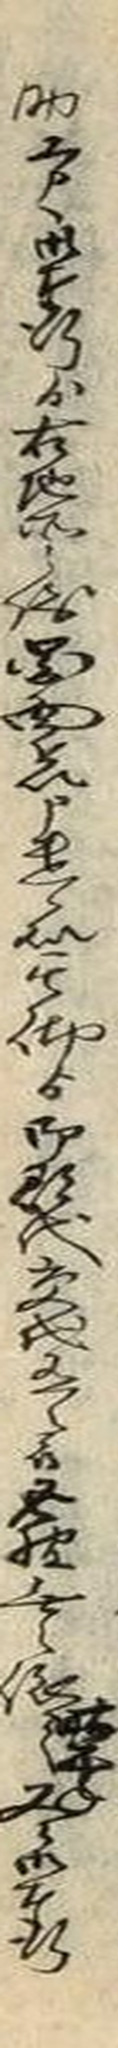助方へ御奉行ゟ右地所之儀図面を以申遣候処其砌ゟ御郡代交代有之ニ付返報無之依之昨午年又々御奉行
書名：御国他国諸事之部
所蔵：福井県文書館 Fukui Prefectural Archives
